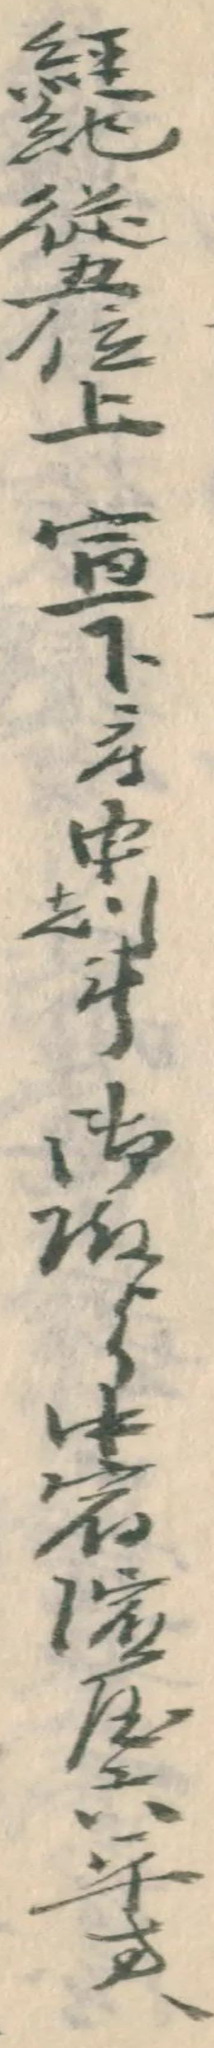経紀従五位上宣下ニ付申刻斗御殿より中宿濱屋六平方へ
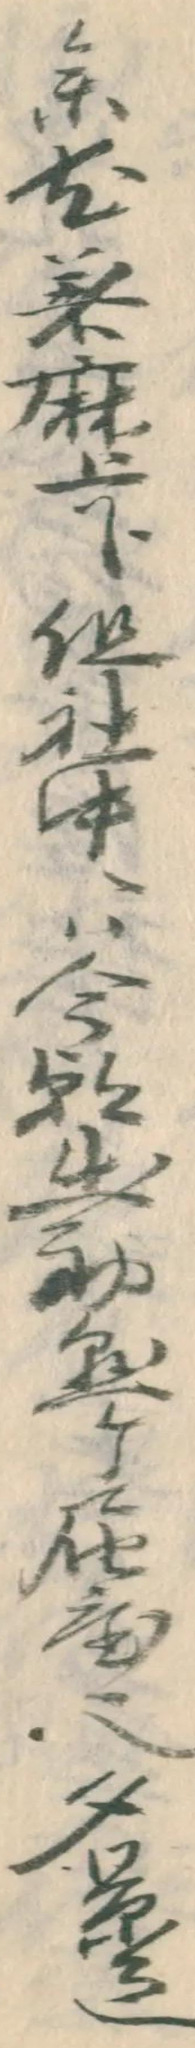参尤着麻上下但社中へハ今朝出勤懸ケ届置也夕景過
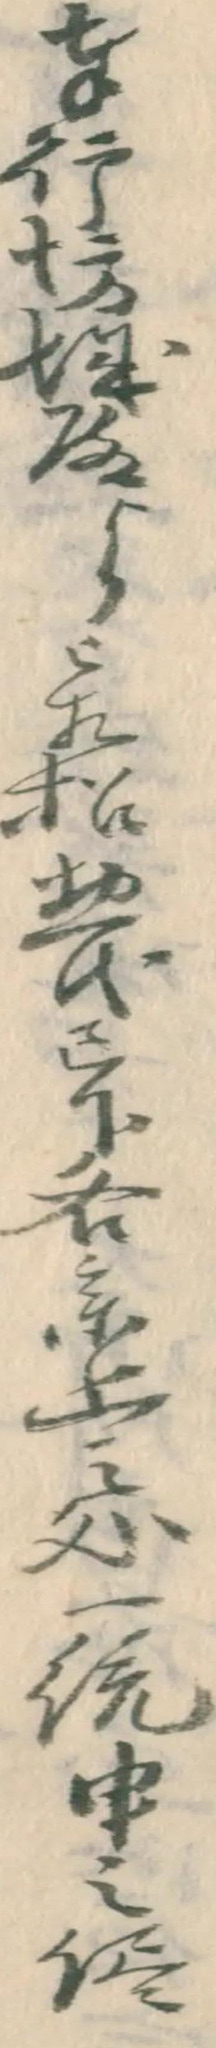奉行坊城殿より被相招惣代已下各参上之処一統申之侭
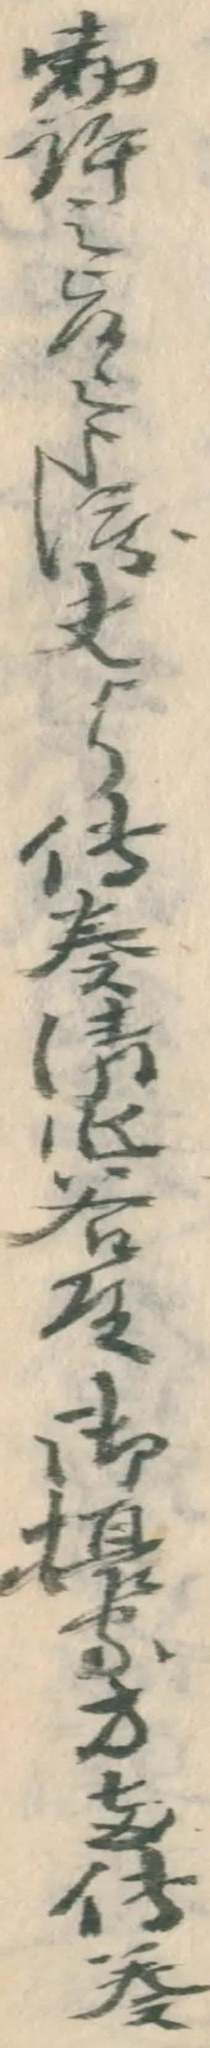勅許之旨被申渡夫より傳奏清水谷殿御摂家方両傳奏

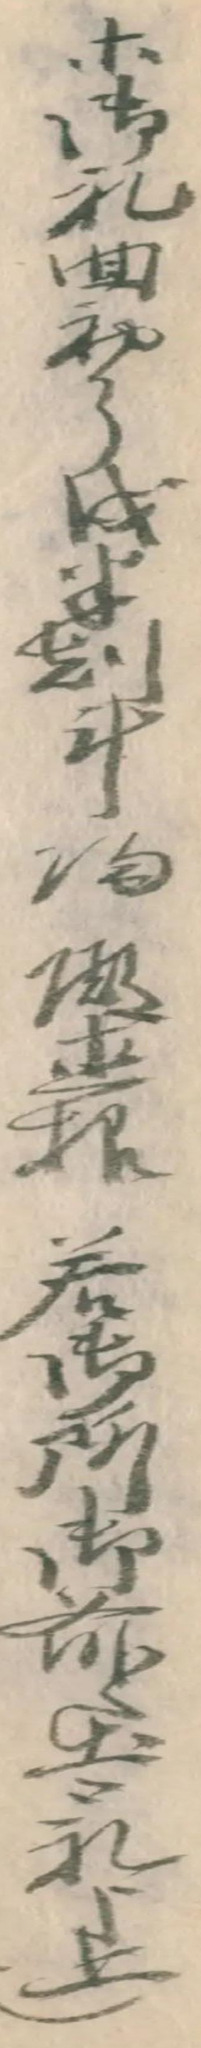等御礼回勤了戌半刻斗帰殿直招若御所御前へ出御礼申上也
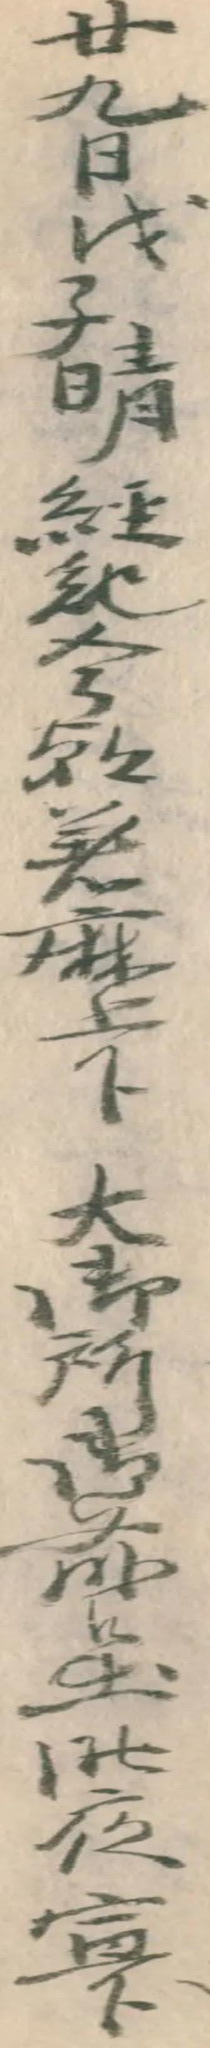廿九日戊子晴経紀今朝着麻上下大御所御前え出昨夜宣下
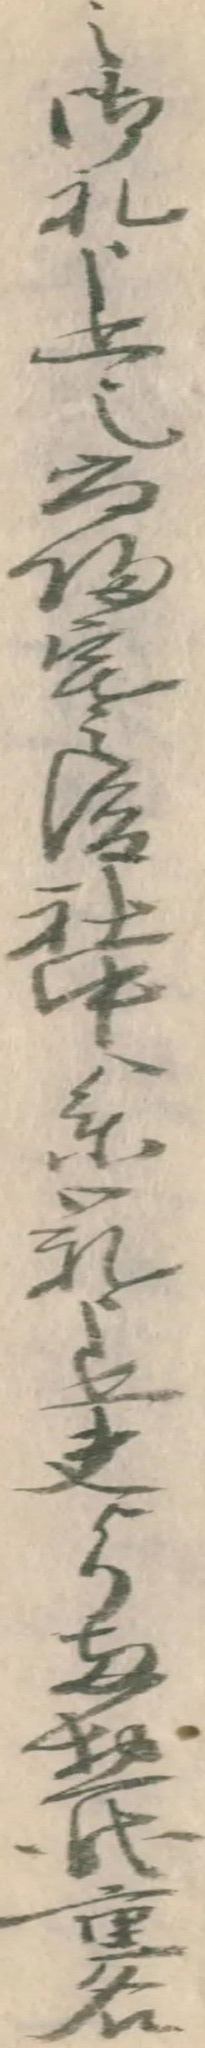之御札申上也尚帰宅之後社中へ参御礼申上夫より両惣代重名
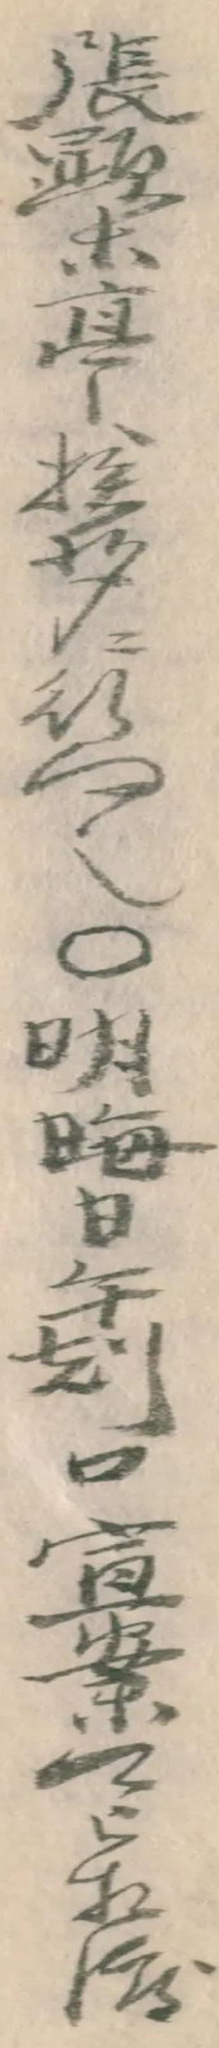張顕等亭へ挨拶ニ行向也○明晦日午刻口宣案可被相渡
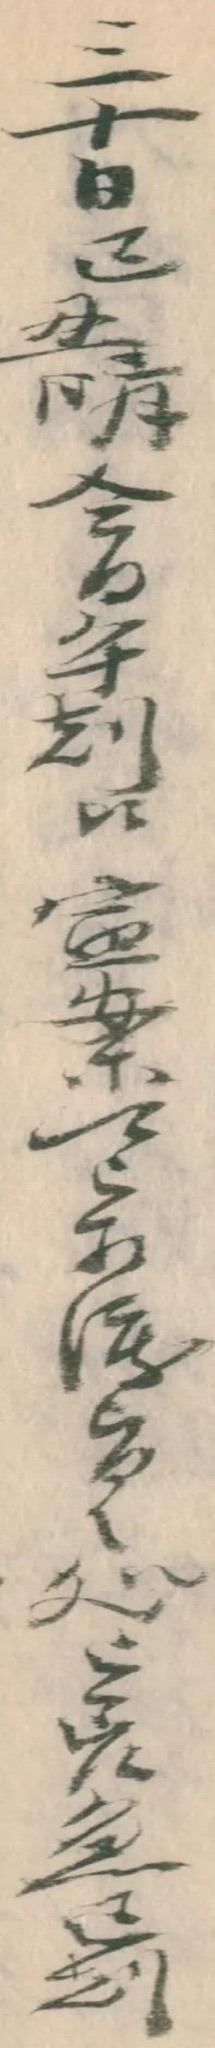三十日己丑晴今日午刻口宣案可被相渡旨之処被差急巳到
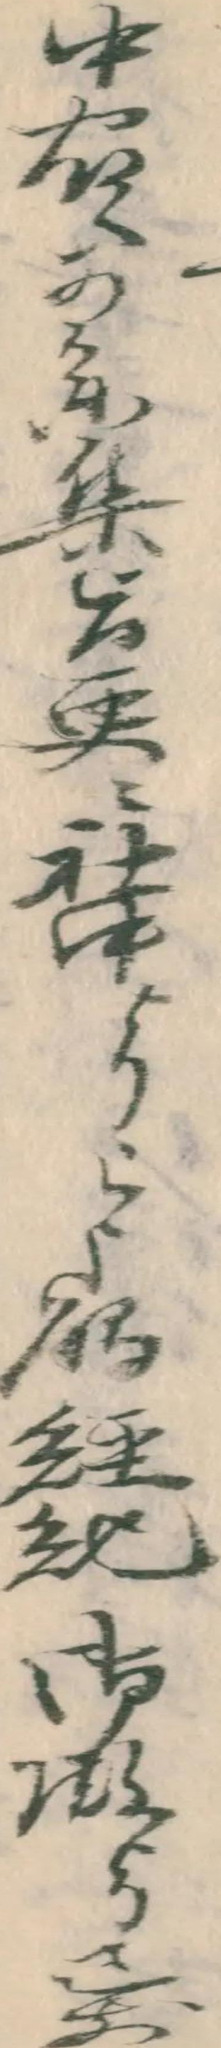中宿へ可参集旨更ニ社中より被申觸経紀御殿より巳前
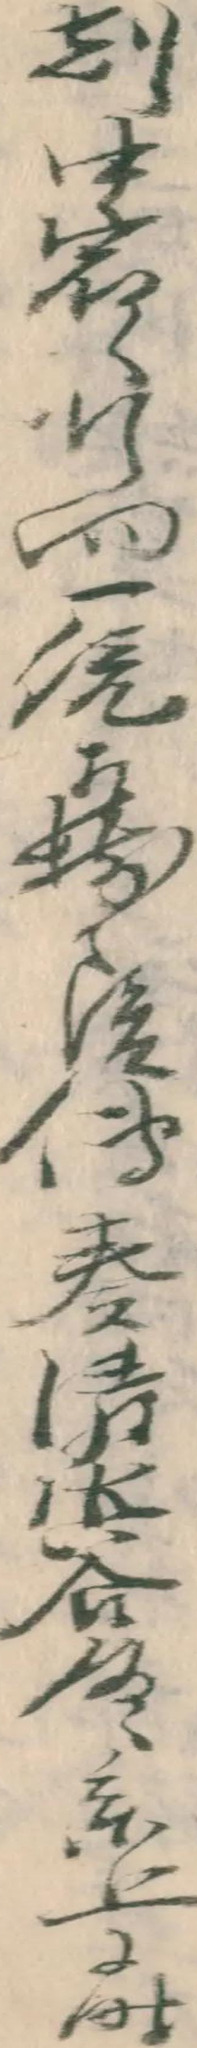刻中宿へ行向一統相揃候後伝奏清水谷殿へ参上于時
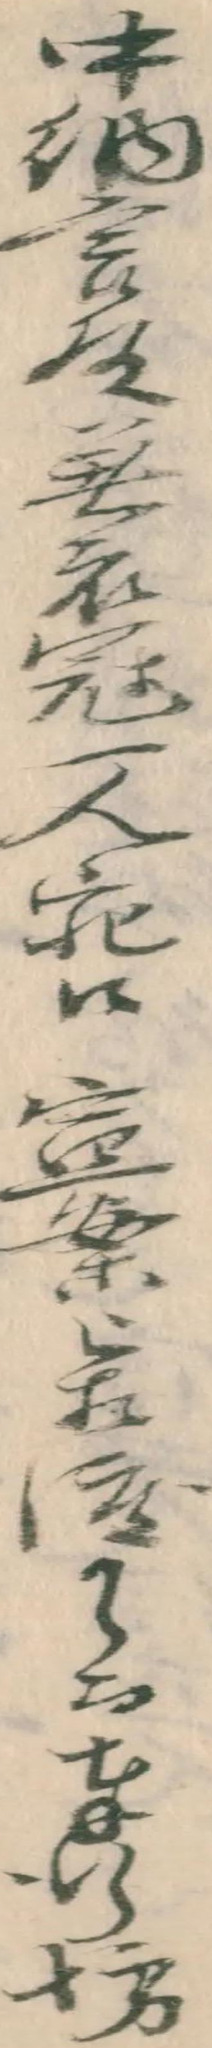中納言殿着衣冠一人宛口宣案被相渡了而奉行坊
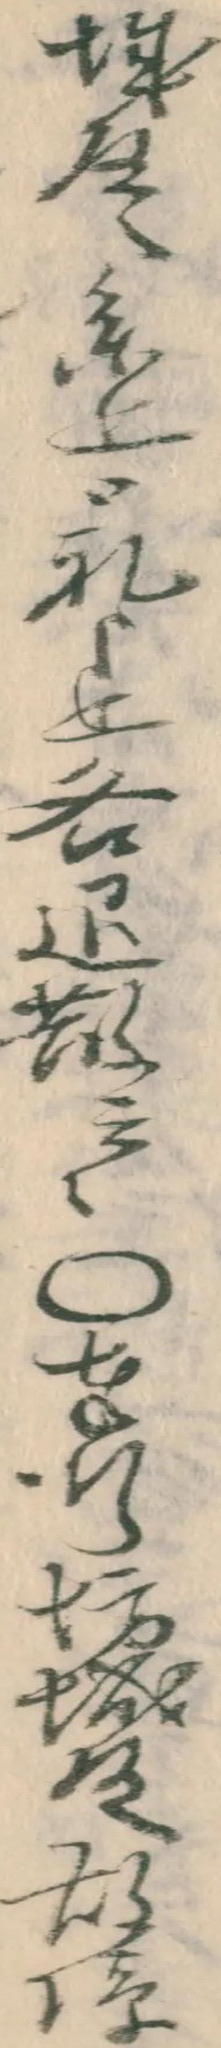城殿へ参上御礼申上各退散云々〇奉行坊城殿故障
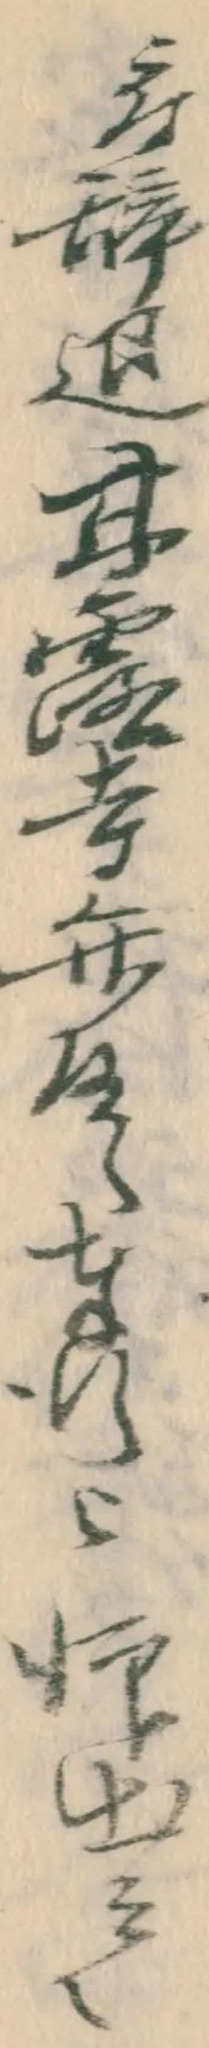ニ付辞退甘露寺弁殿へ奉行被仰出云々
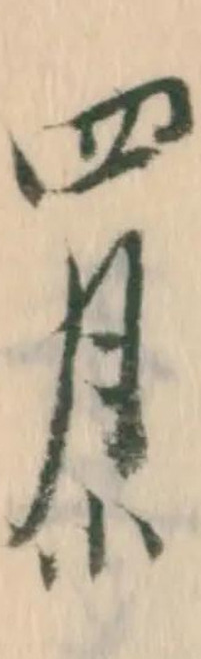四月小
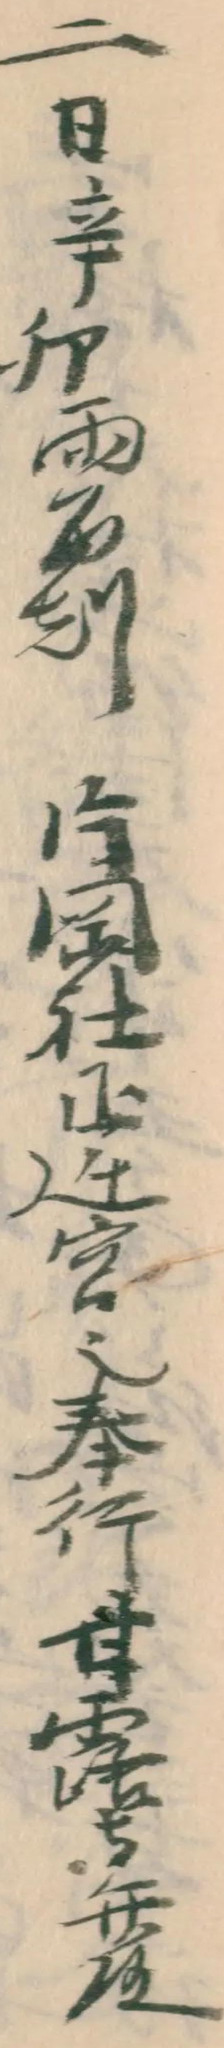二日辛卯雨酉刻片岡社正遷宮也奉行甘露守弁殿
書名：賀茂社記録. 第67冊
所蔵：国立国会図書館 National Diet Library, JAPAN
